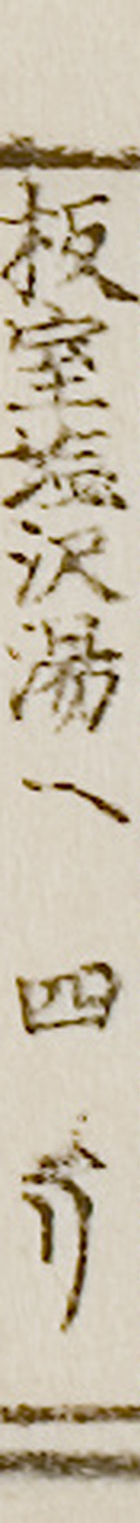板室塩沢湯ヘ四リ
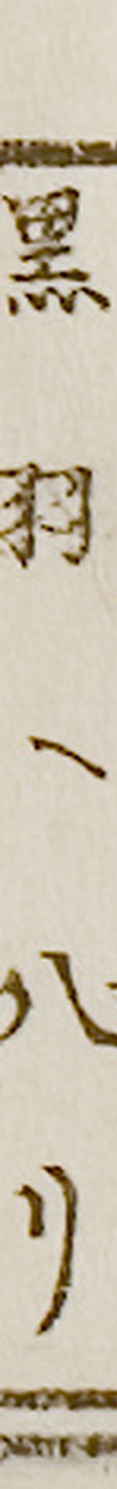黒羽へ八リ
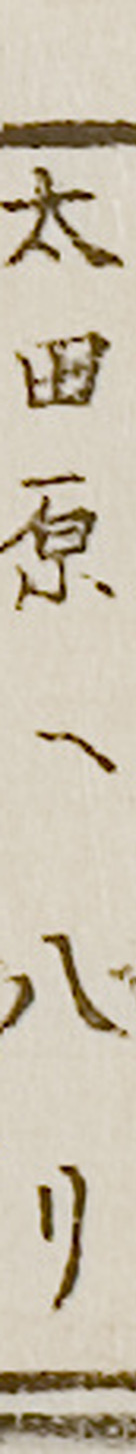太田原ヘ八リ
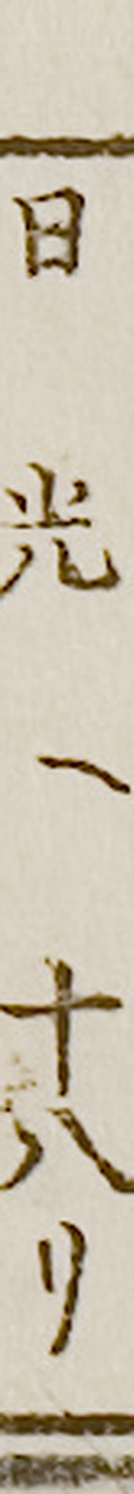日光ヘ十八リ
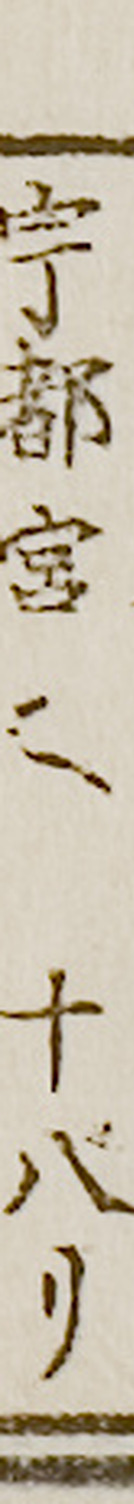宇都宮ヘ十八リ
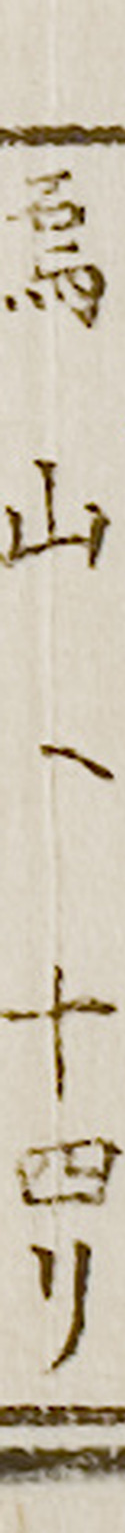烏山ヘ十四リ
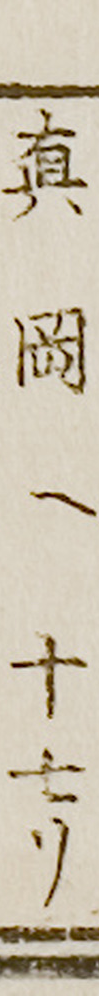真岡ヘ十七リ
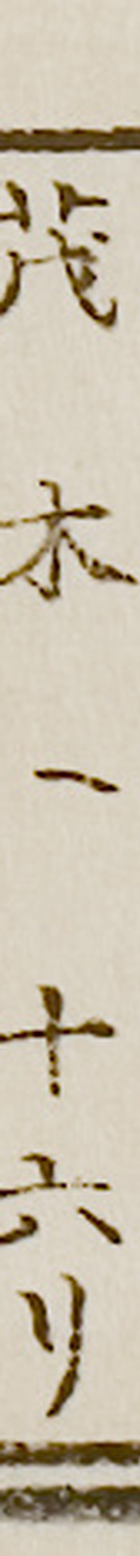茂木ヘ十六リ
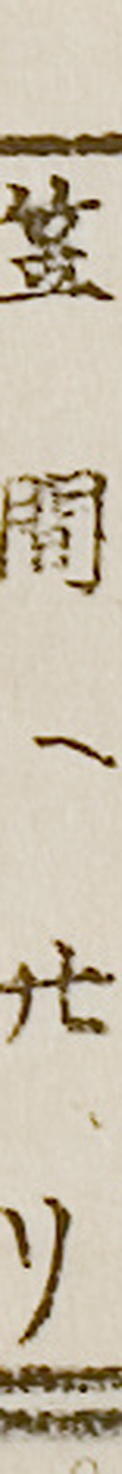笠岡ヘ廿リ
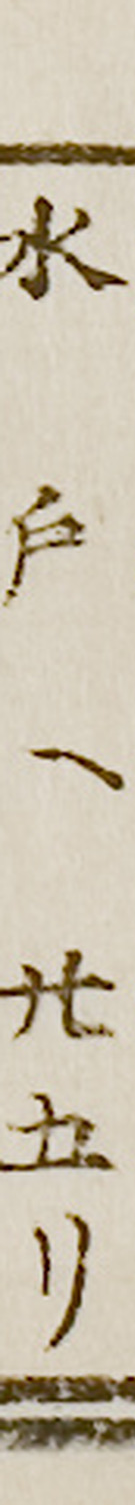水戸ヘ廿五リ
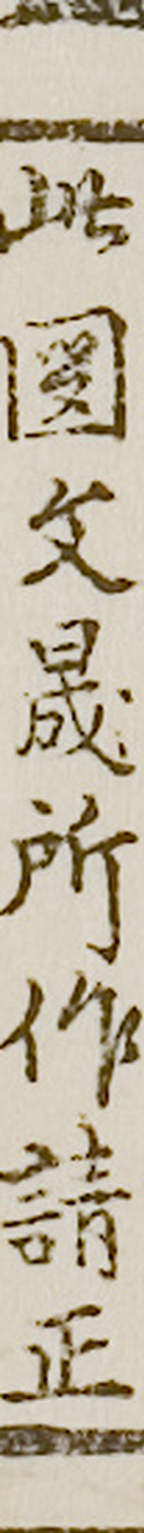此図文晟所作請正
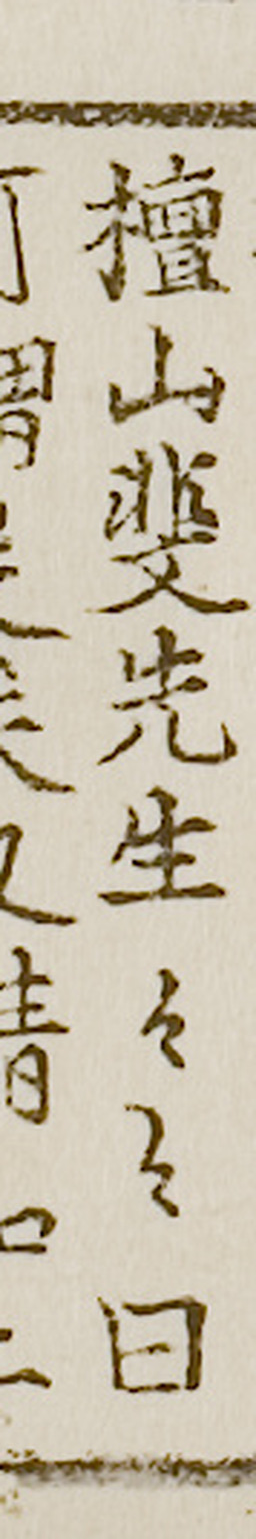可謂是矣又請加二
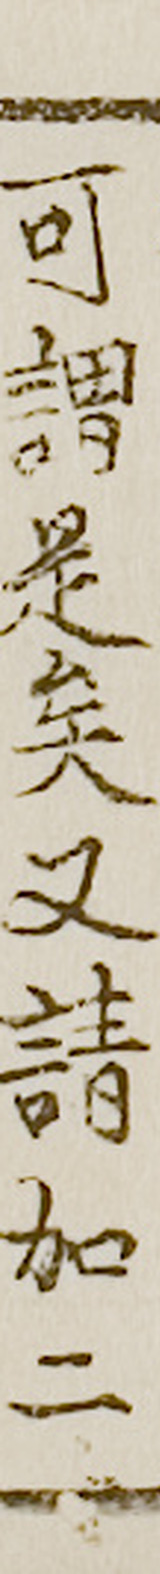可謂是矣又請加二
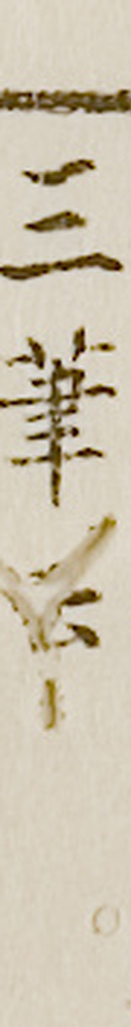三筆云
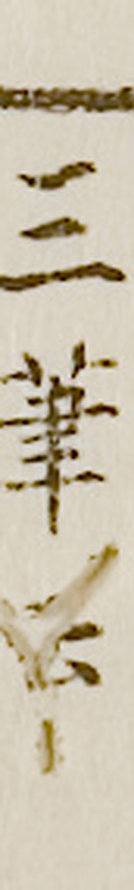三筆云
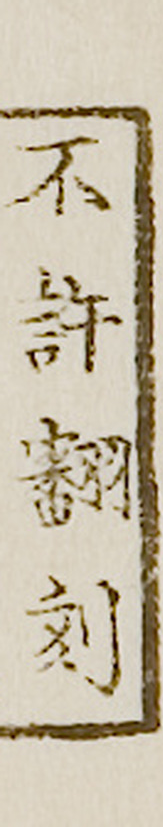不許翻刻
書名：下野国那須郡那須湯本図
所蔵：東京大学総合図書館 General Library in the University of Tokyo, JAPAN
